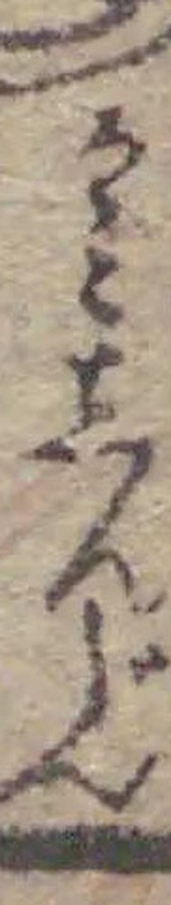かみしんじん
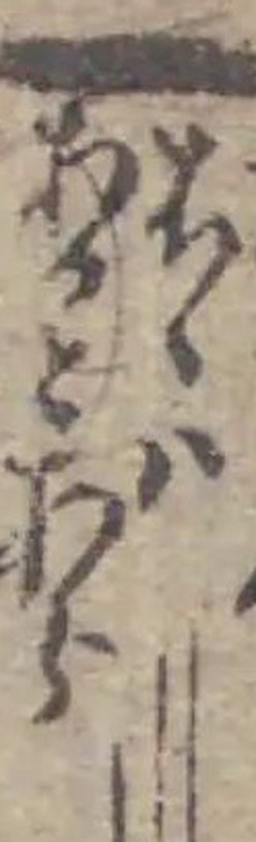ありとあら
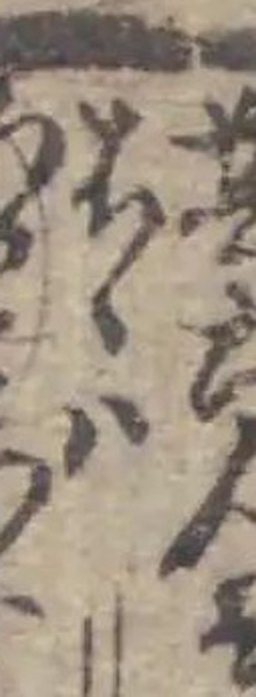はゝは
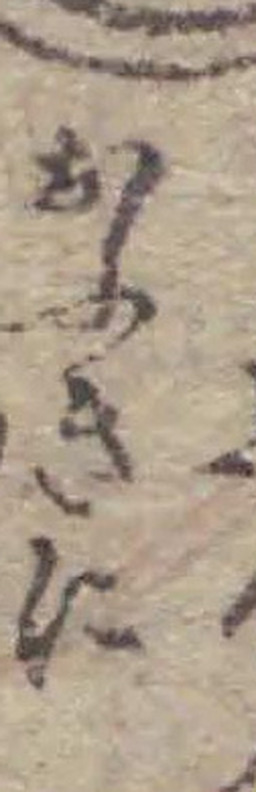おふきに
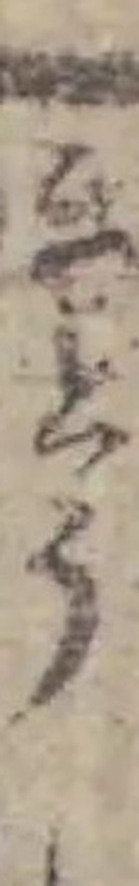きとう
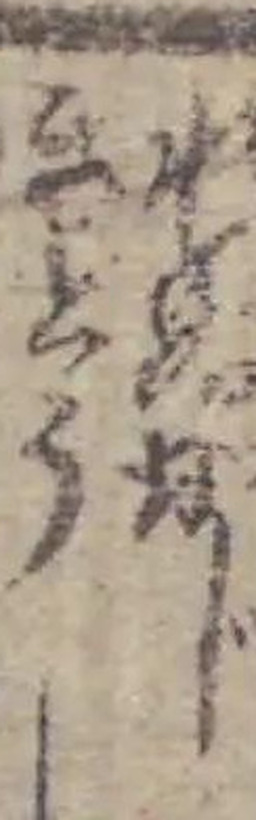きとう
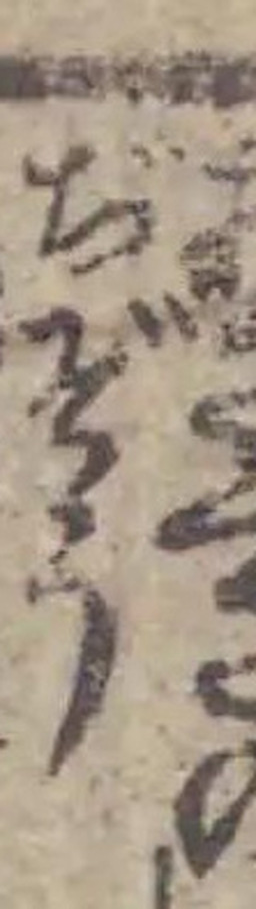ぢぞう
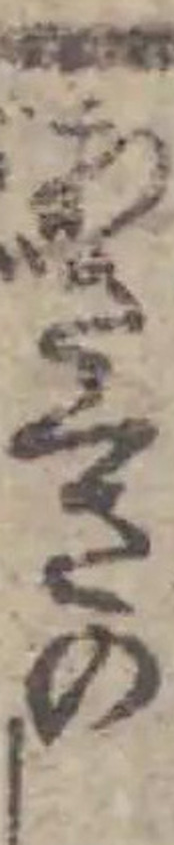あさくさの
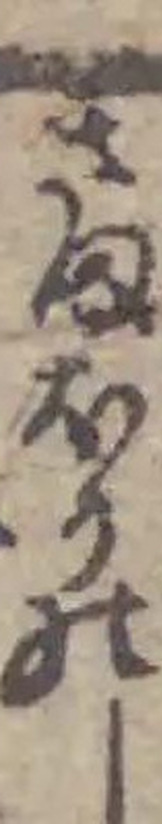さまほかの
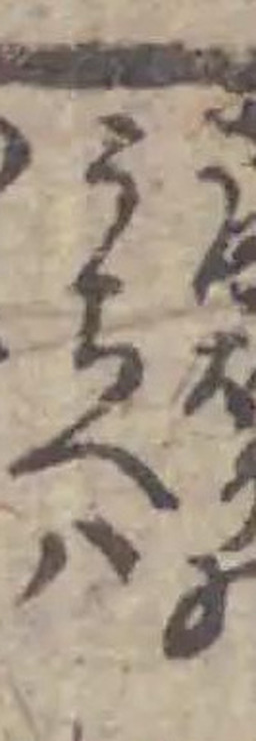うちへは
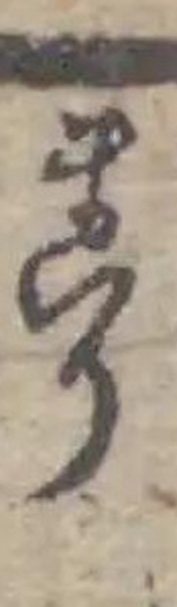まいり
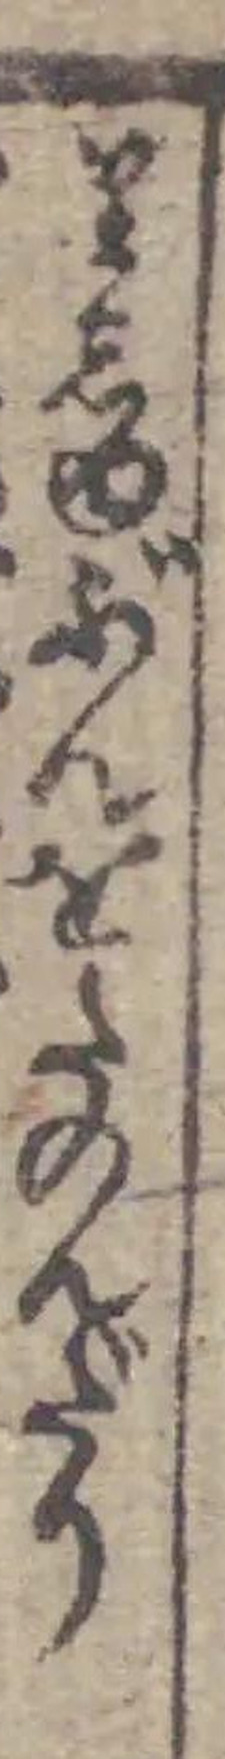りしゆぶんをたのんだり
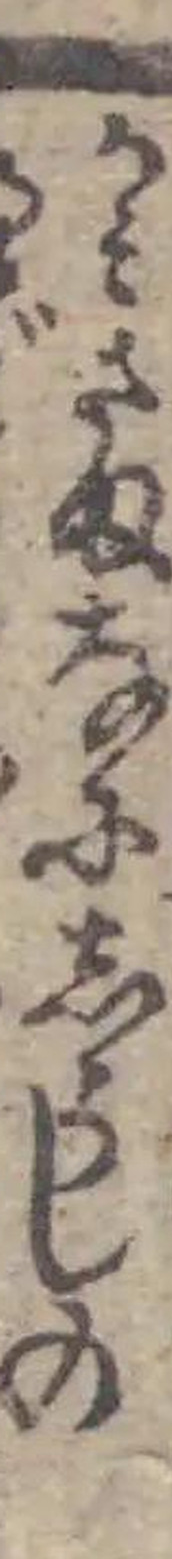かみさまなにしうしの
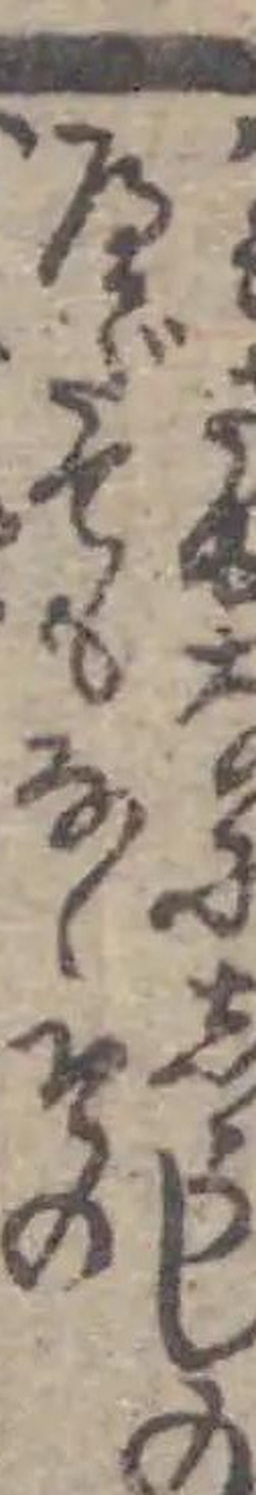へだてもなくその
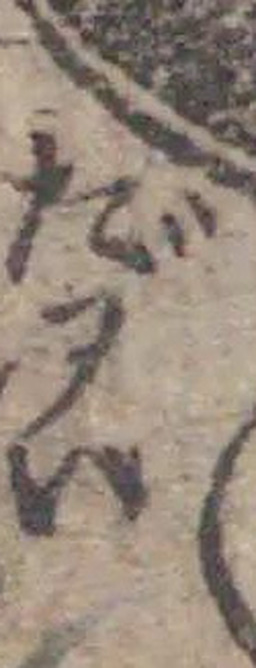だアい
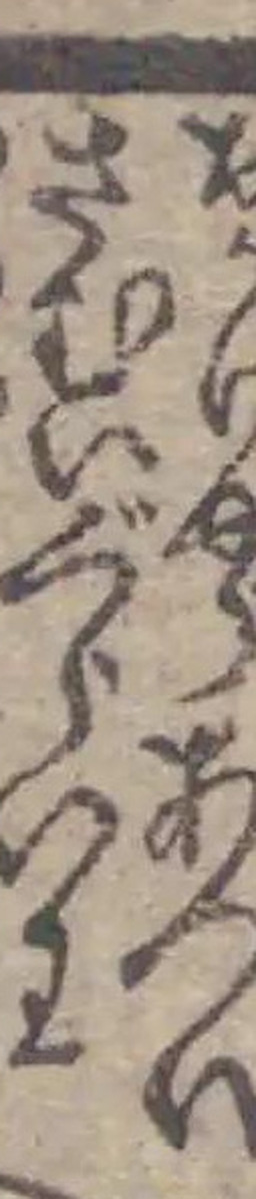さむいぐらいわ
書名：津以曽無弟の甚六 3巻
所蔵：国立国会図書館 National Diet Library, JAPAN
